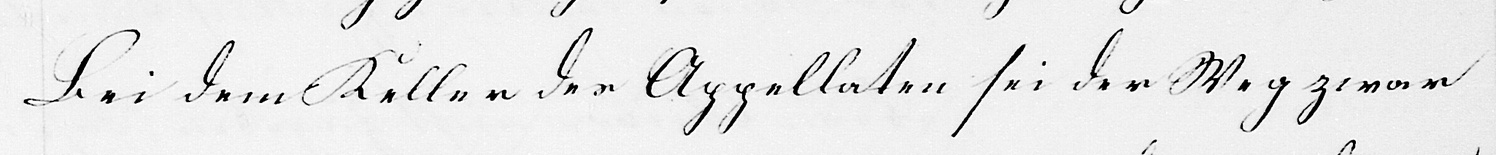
Bei dem Keller des Appellaten sei der Weg zwar
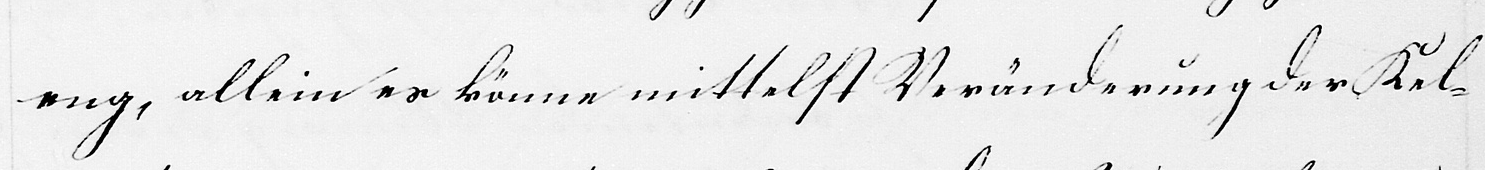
eng, allein es könne mittelst Veränderung der Kel¬
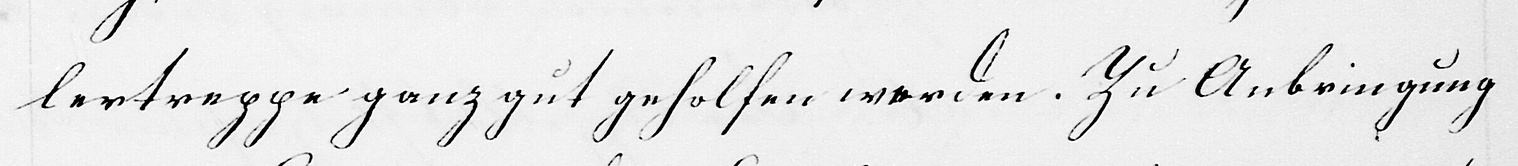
lertreppe ganz gut geholfen werden. Zu Anbringung
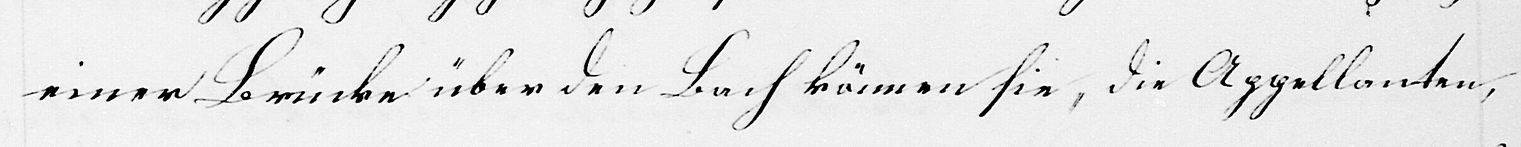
einer Brücke über den Bach können sie, die Appellanten,
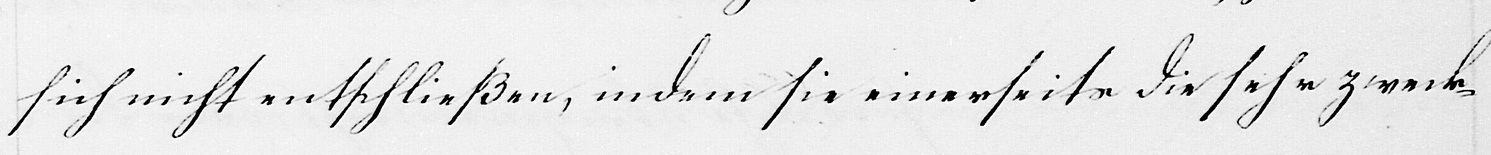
sich nicht entschließen, indem sie einerseits die sehr zweck¬
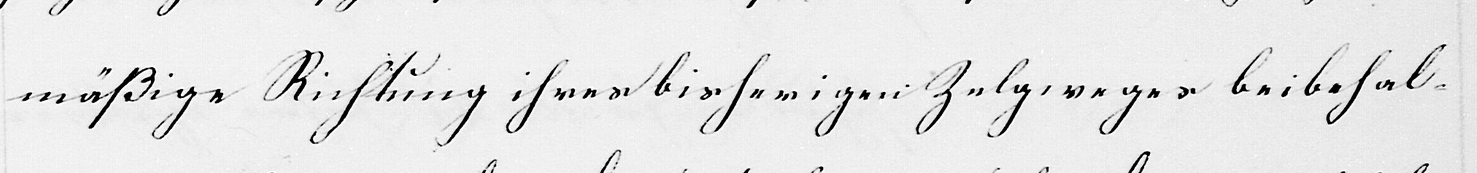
mäßige Richtung ihres bisherigen Zelgweges beibehal¬
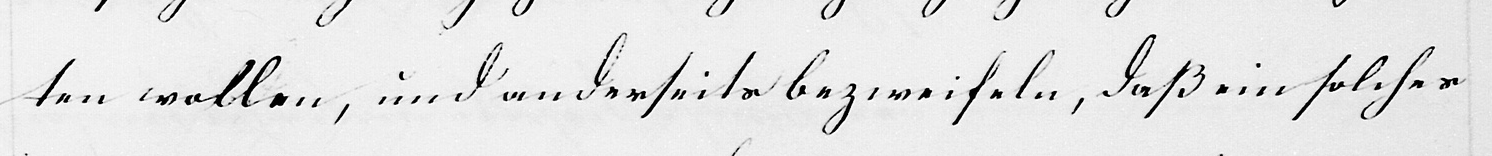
ten wollen, und anderseits bezweifeln, daß ein solches
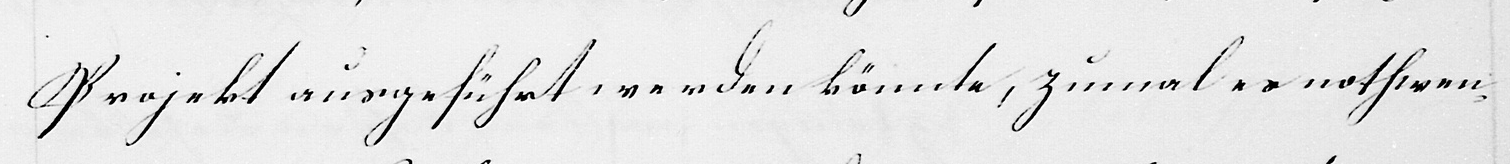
Projekt ausgeführt werden könnte, zumal es nothwen¬
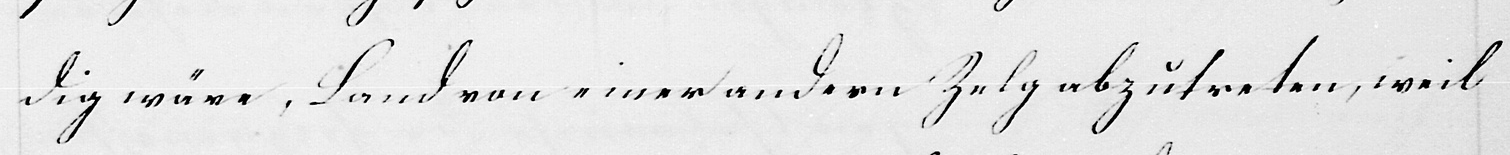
dig wäre, Land von einer andern Zelg abzutreten, weil
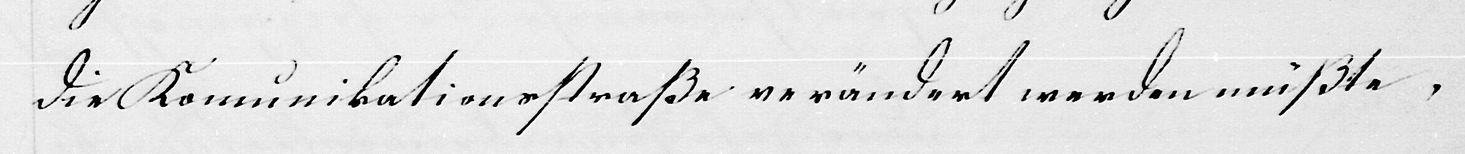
die Komunikationsstraße verändert werden müßte,
